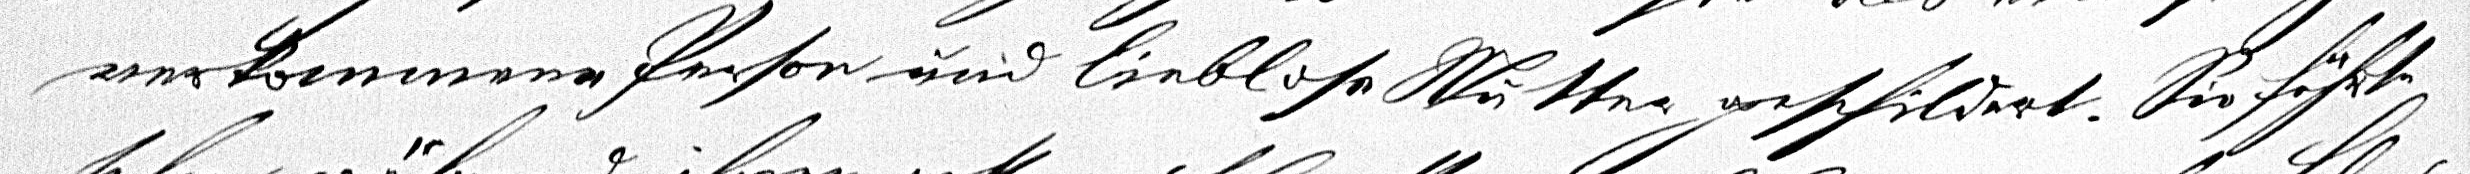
verkommene Person und lieblose Mutter geschildert. Sie föhrte
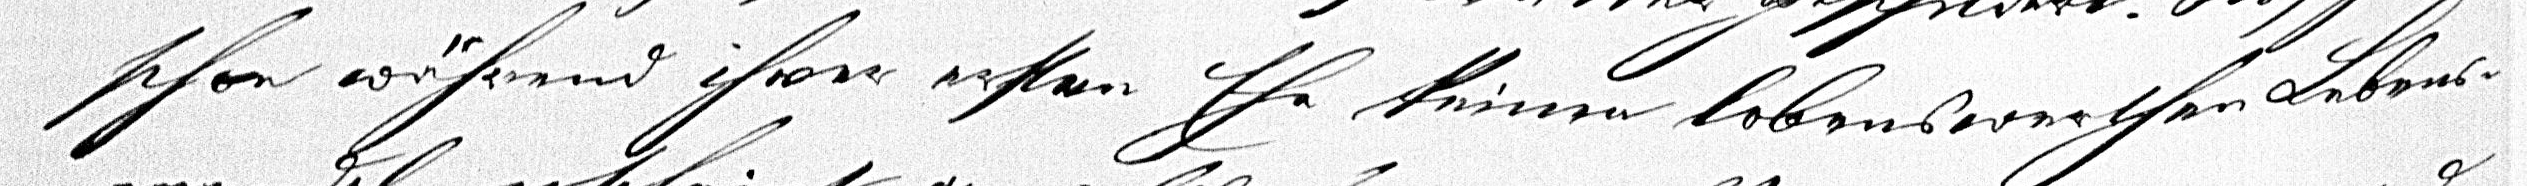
schon während ihrer erster Ehe keime lobenswerthen Lebens¬
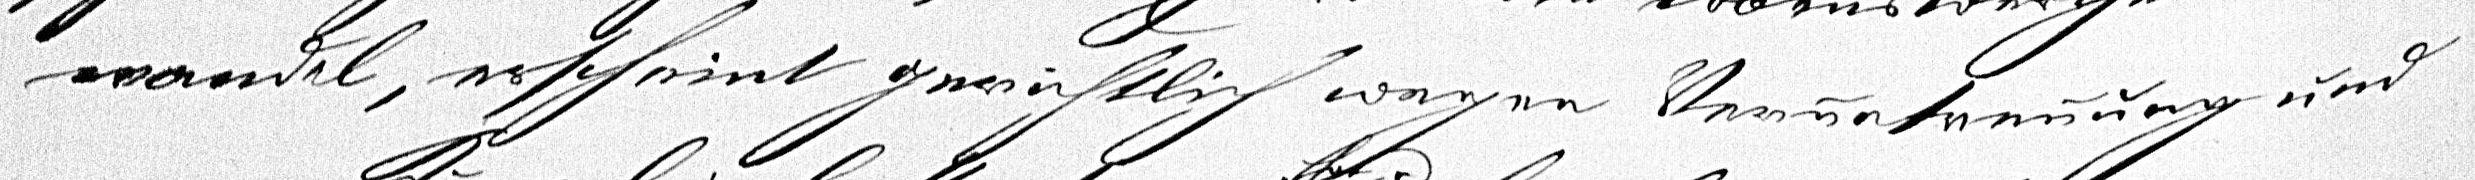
wandel, erscheint gerichtlich wegen Veruntreuung und
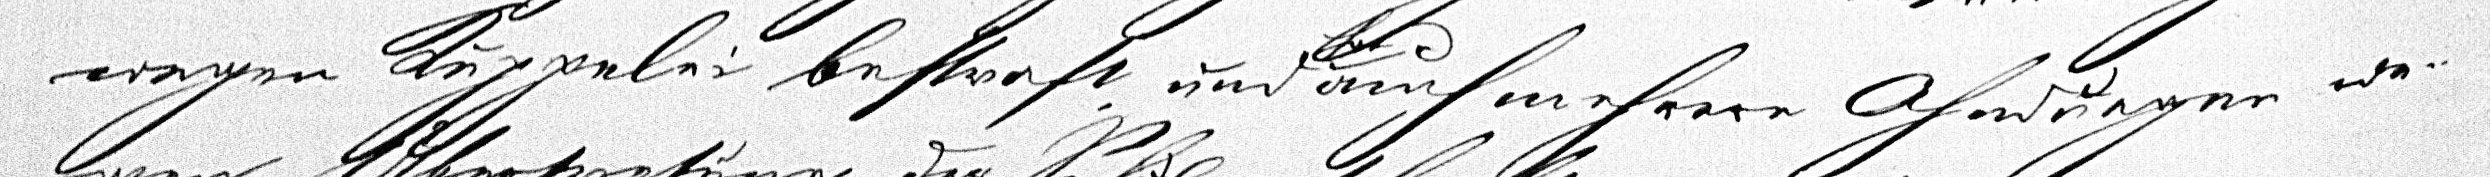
wegen Kuppelei bestraft und auch mehrere Ahndungen we¬
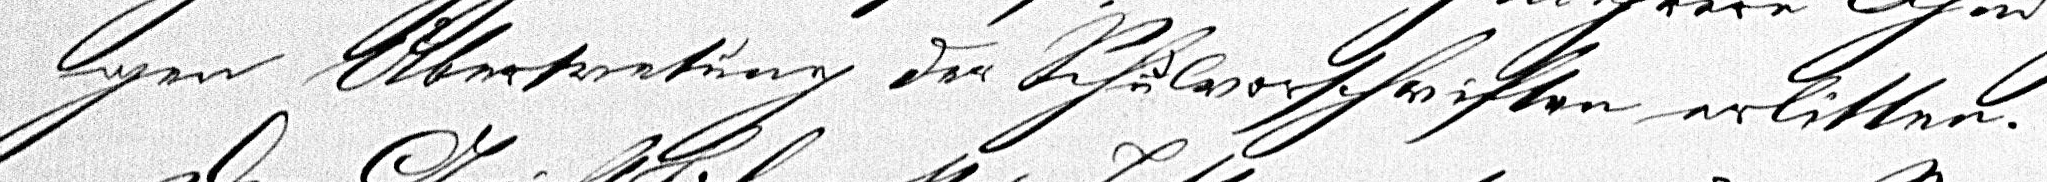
gen Übertretung der Schulvorschriften erlitten.
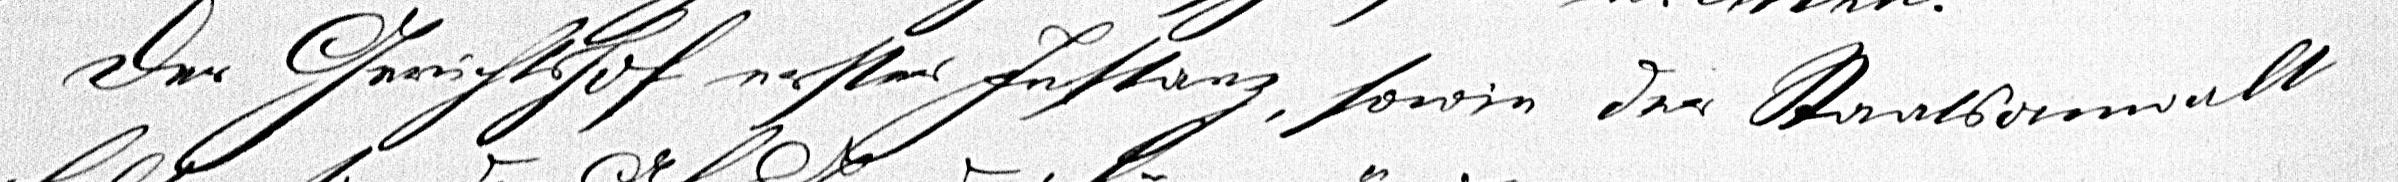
Der Gerichtshof erster Instanz, sowie der Staatsanwalt
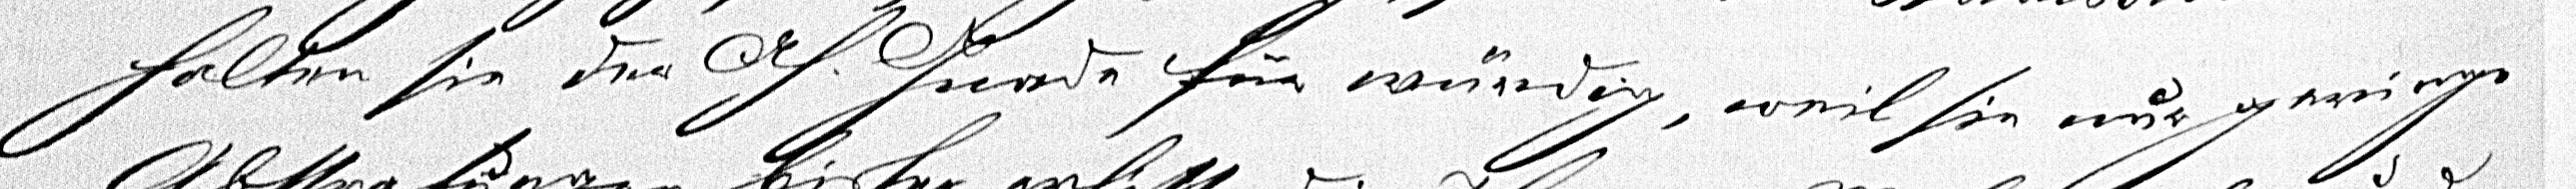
Holten sie der As. Gunde für würdig, weil sie nur geringe
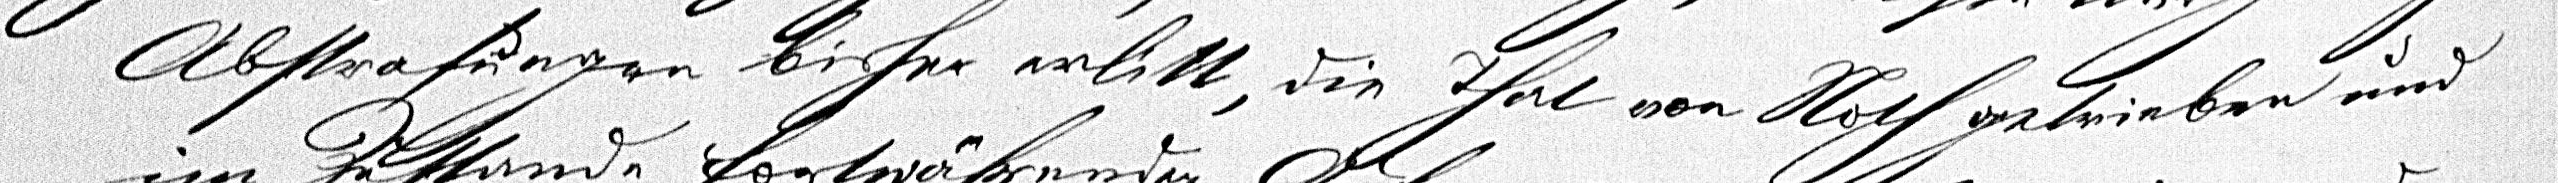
Abstrafungen bisher erlitt, die That von Noch getrieben und
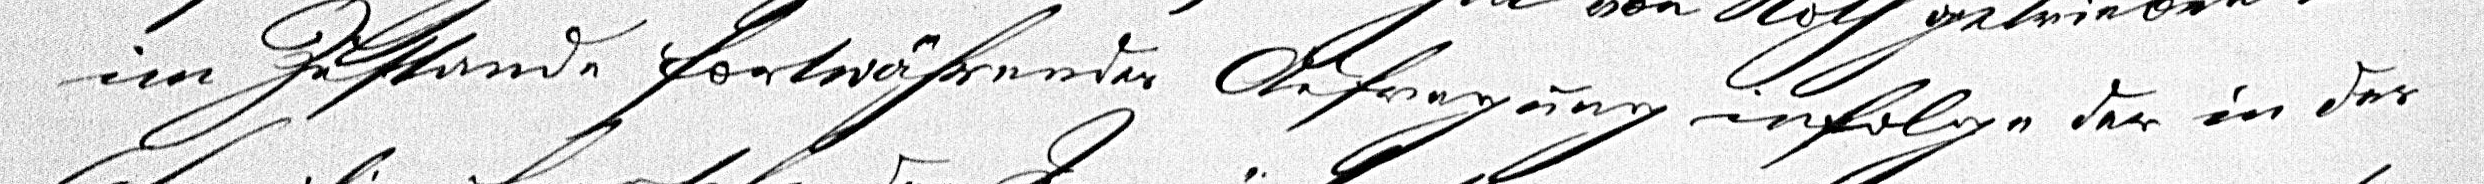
im Zustande fortwährender Aufregung infolge der in der
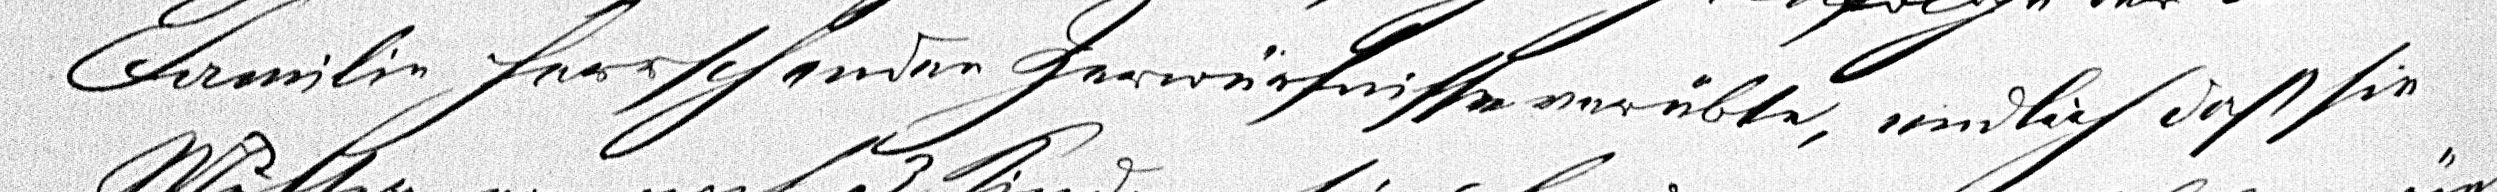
Familie Herrschenden Zerwürfnisse verübte, endlich daß sie
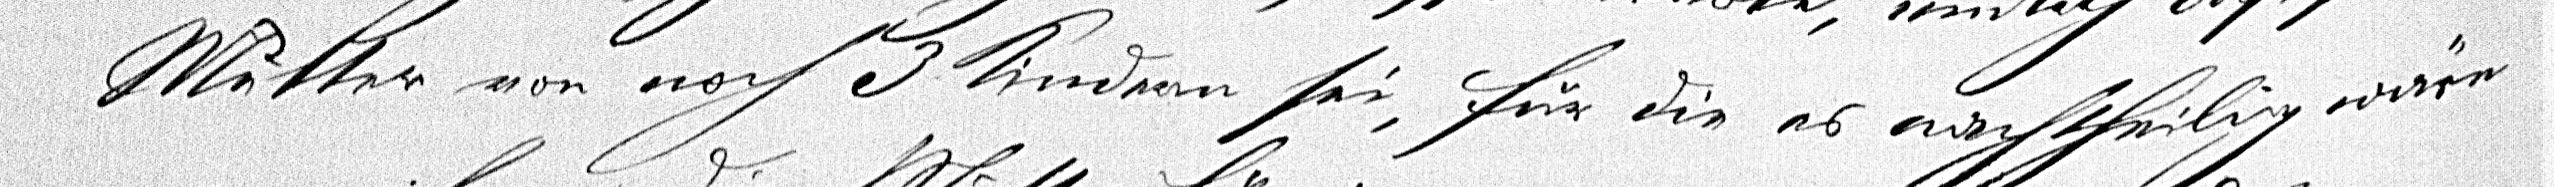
Mutter von noch 3 Kindern sei, für die es nachtheilig wäre
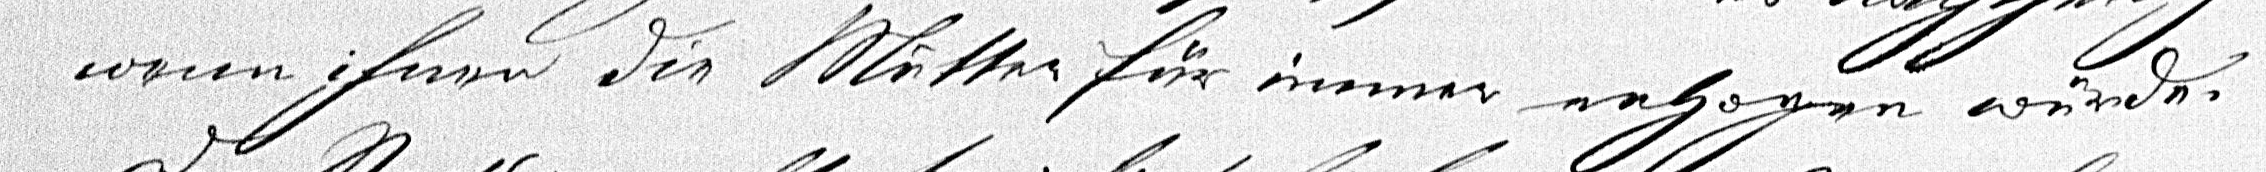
wenn ihnen die Mutter für immer entzogen würde.
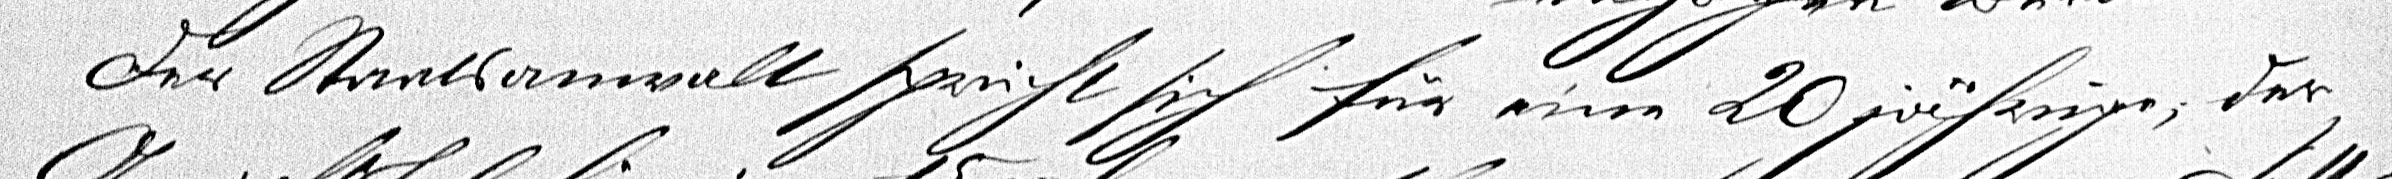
Der Staatsanwalt spricht sich für eine 20 jährige, der
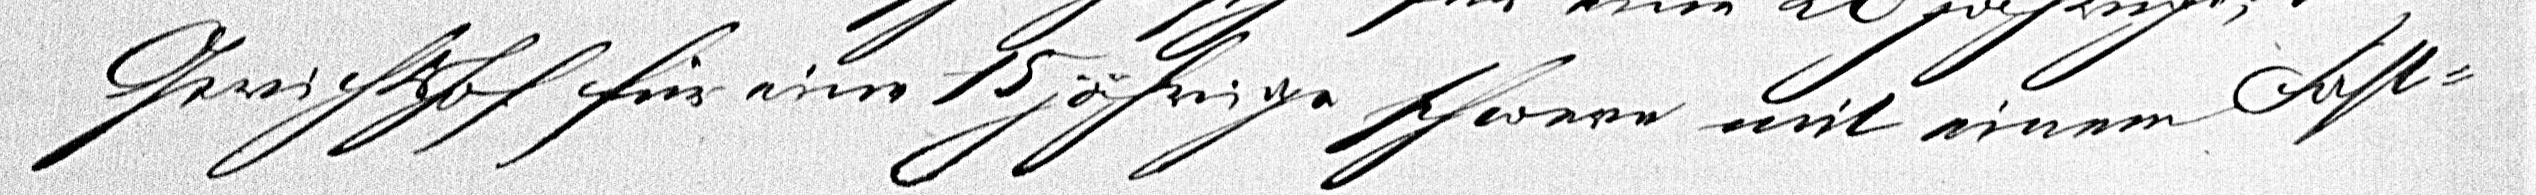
Gerichtshof für eine 15 jährige schwere mit einem Fast
